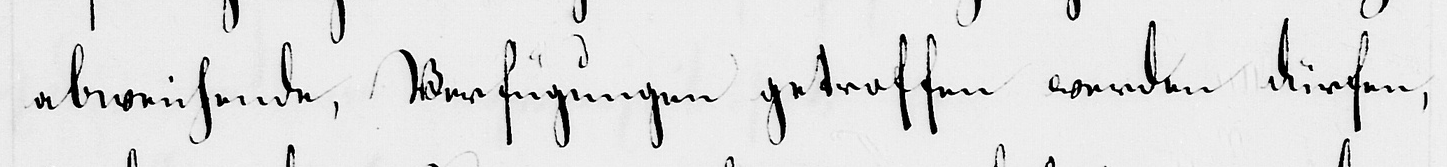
abweichende, Verfügungen getroffen werden dürfen,
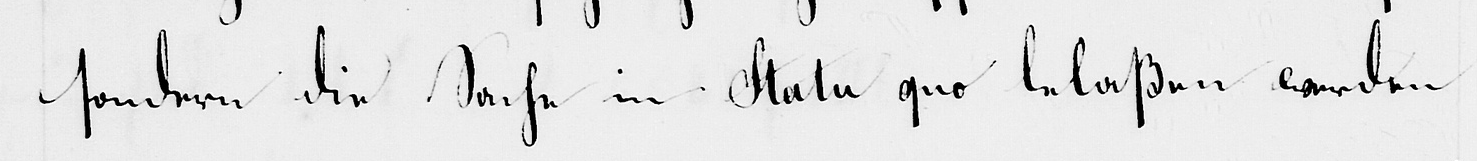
sondern die Sache in Statu quo belaßen werden
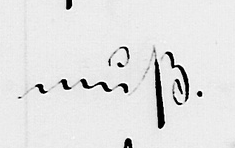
muß.
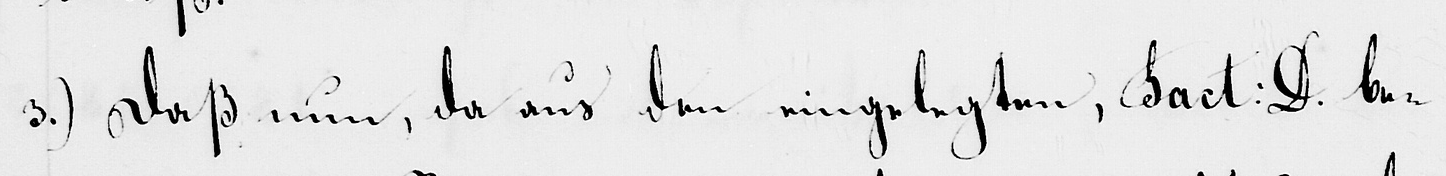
3.) Daß nun, da aus den eingelegten, Fact: D. be¬
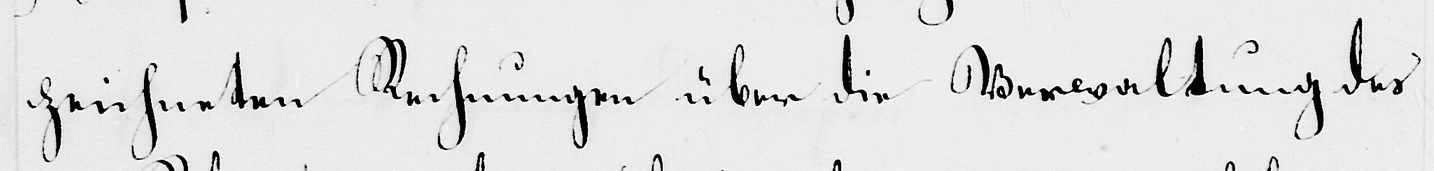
zeichneten Rechnungen über die Verwaltung des
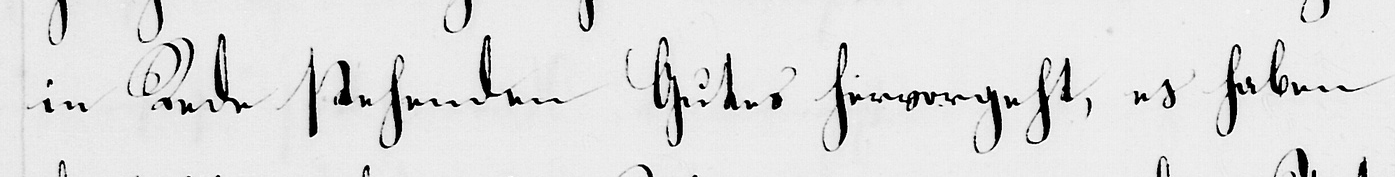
in Rede stehenden Gutes hervorgeht, es haben
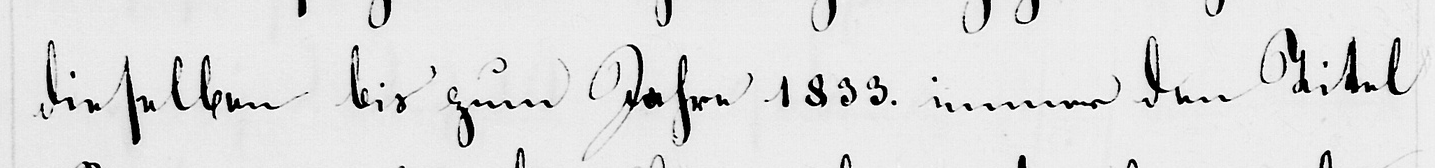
dieselben bis zum Jahre 1833. immer den Titel
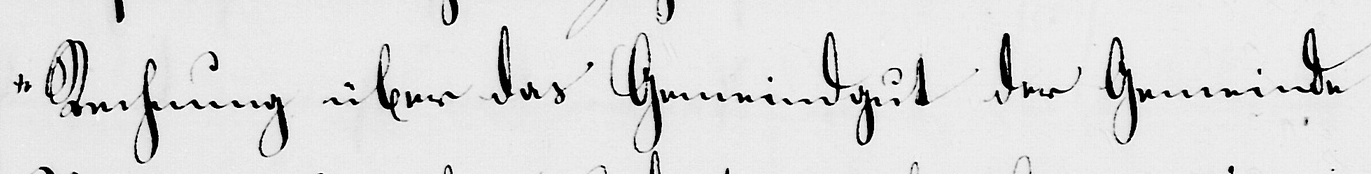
„Rechnung über das Gemeindgut der Gemeinde
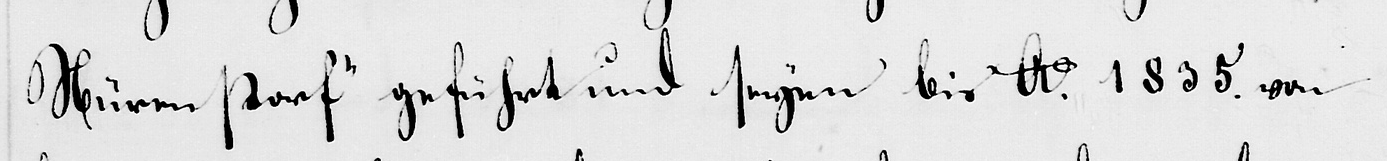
Nürenstorf“ geführt und seyen bis A°. 1835. von
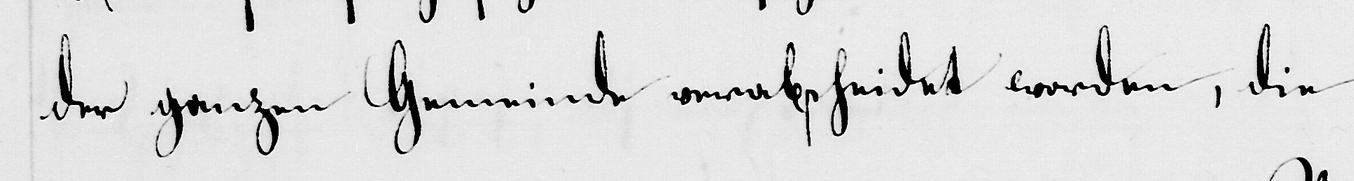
der ganzen Gemeinde verabscheidet worden, die
